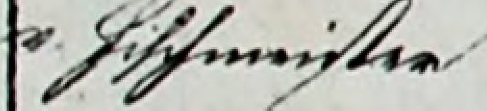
v. Fischmeister
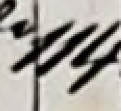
114
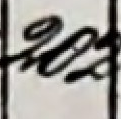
202
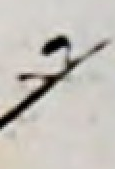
7
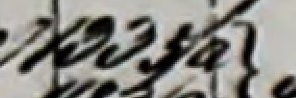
1335/a
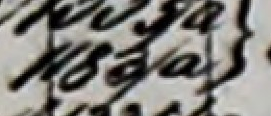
1183/a
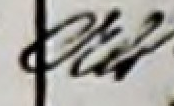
Alt
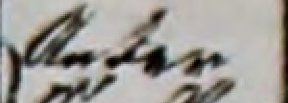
An der
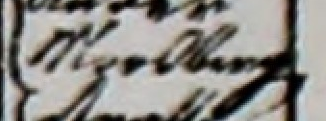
Marsberg„
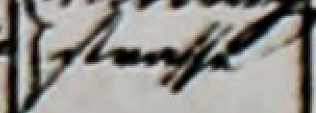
straffe
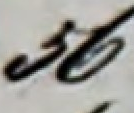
56
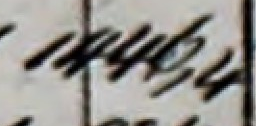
1446,4
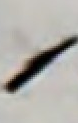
1
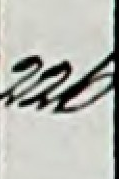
226
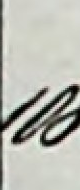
108
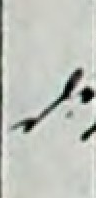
do
